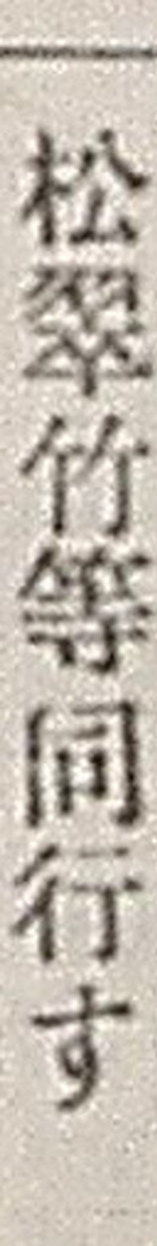松翠竹等同行す
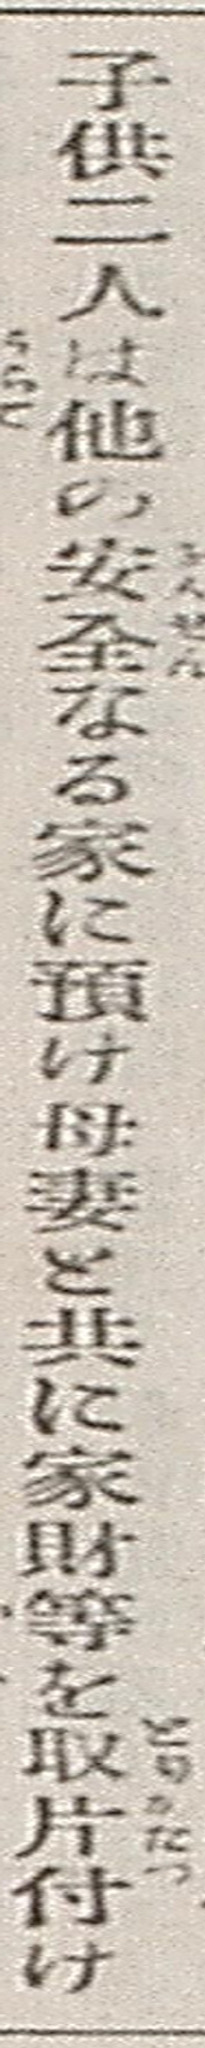子供二人は他の安全なる家に預け母妻と共に家財等を取片付け
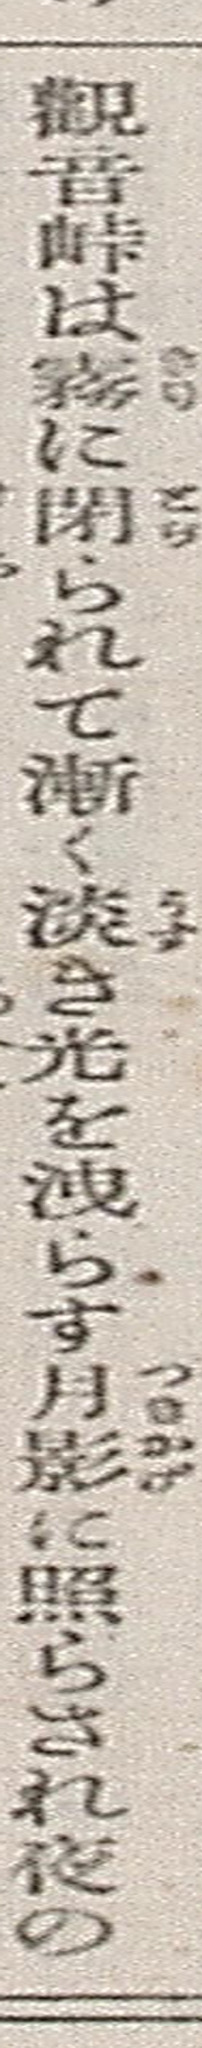観音峠は霧に閉られて漸く淡き光を漏らす月影に照らされ夜の
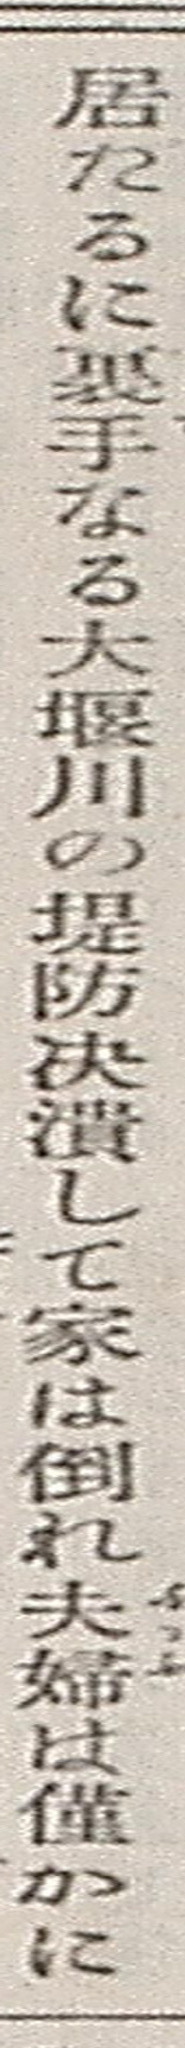居たるに裏手なる大堰川の堤防决潰して家は倒れ夫婦は僅かに
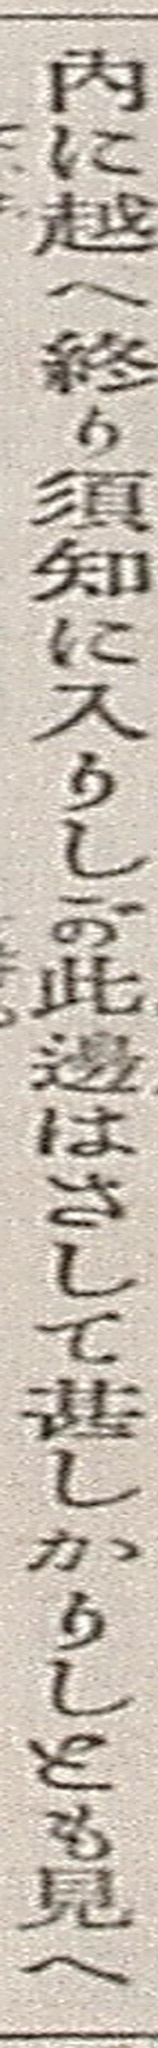内に越へ終り須地に入りしが此辺はさして甚しかりしとも見へ
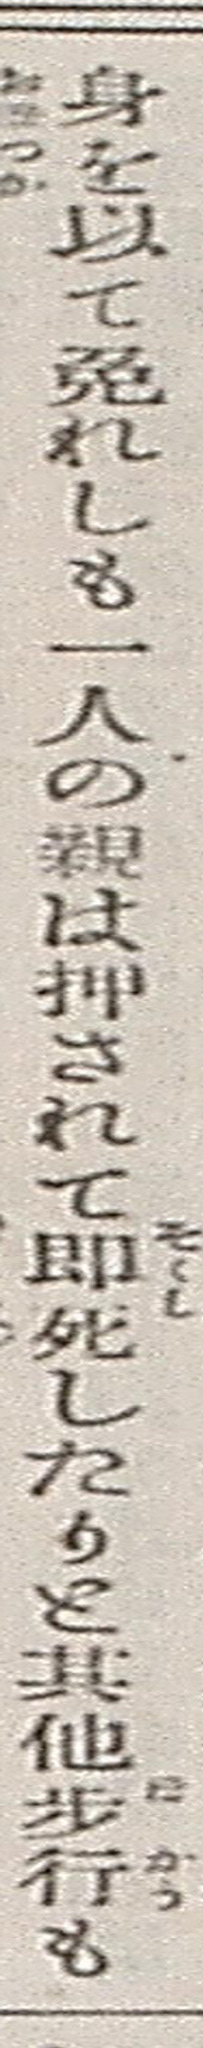身を以て免れしも一人の親は押されて即死したりと其他歩行も
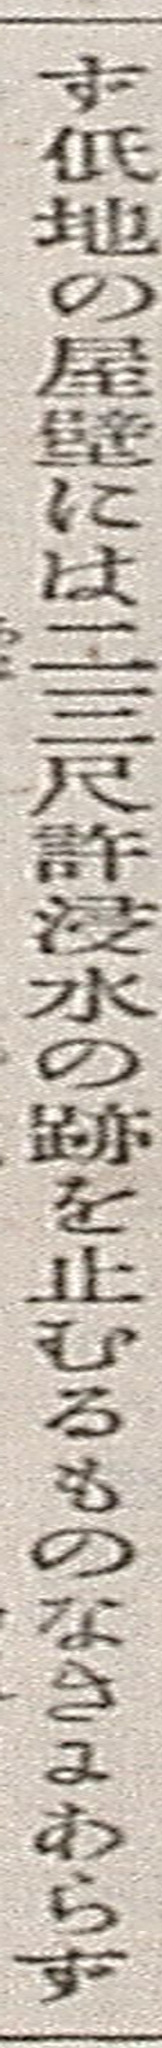ず低地の屋根には二三尺許浸水の跡を止むるものなきにあらず
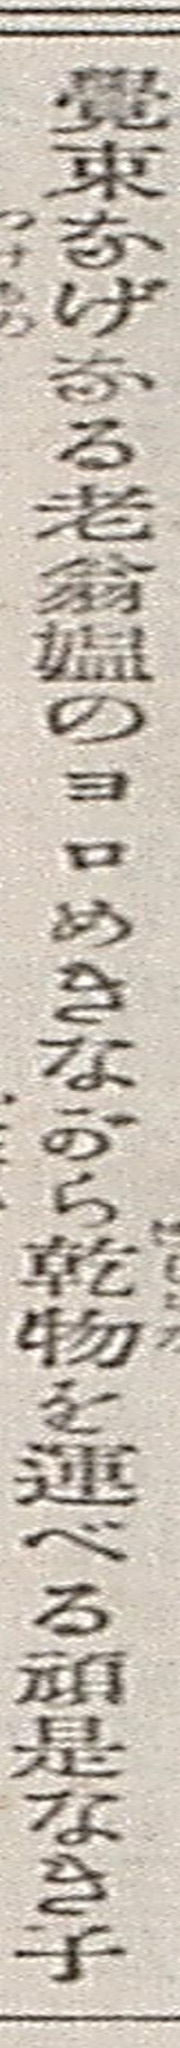覚束なげなる老翁媼のヨロめきながら乾物を運べる頑是なき子
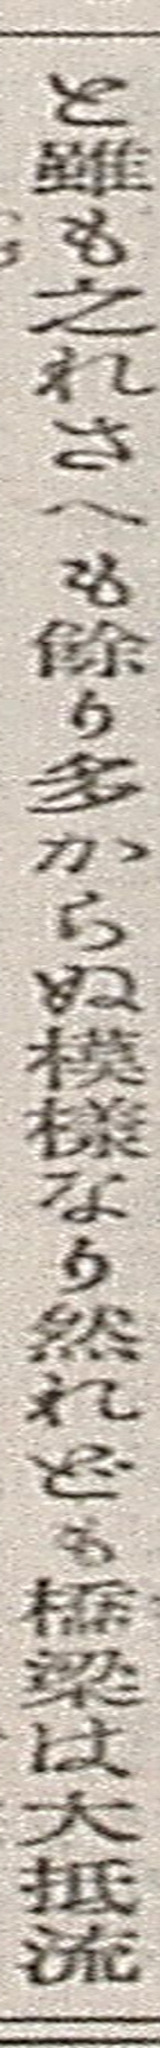と雖も之れさへも餘り多からぬ模様なり然れども橋梁は大抵流
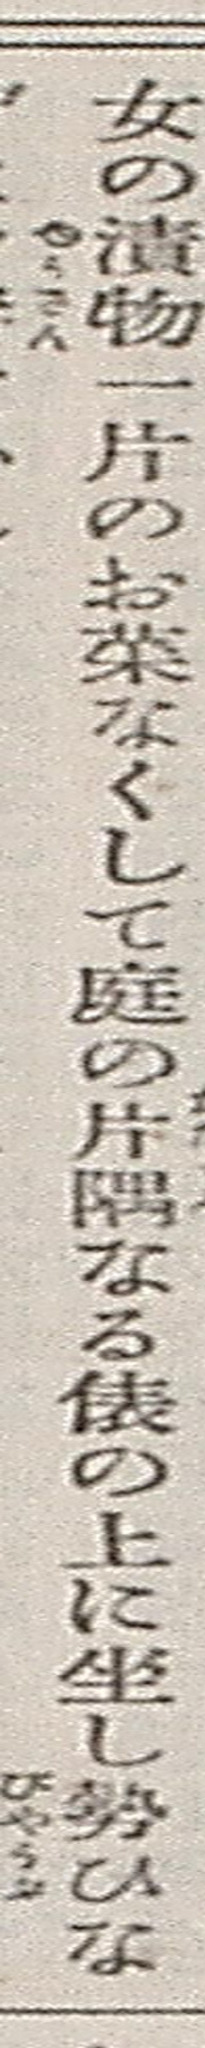女の漬物一片のお菜なくして庭の片隅なる俵の上に坐し勢ひな
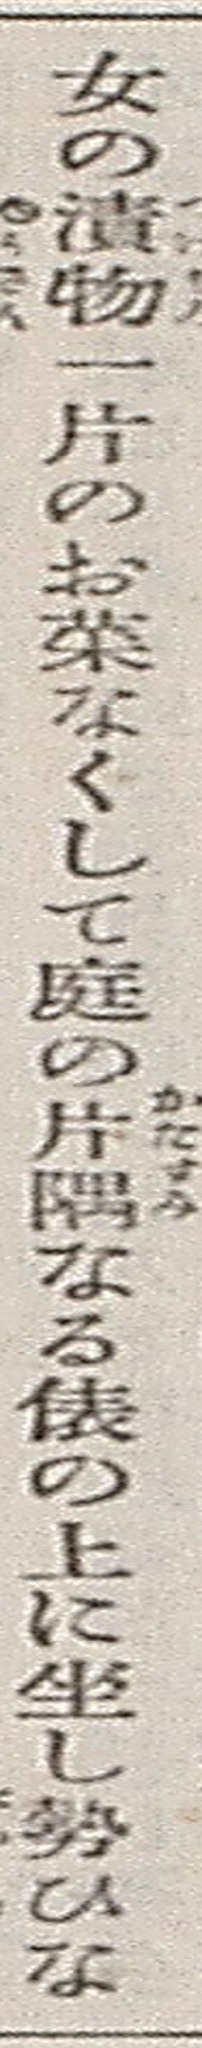女の漬物一片のお菜なくして庭の片隅なる俵の上に坐し勢ひな
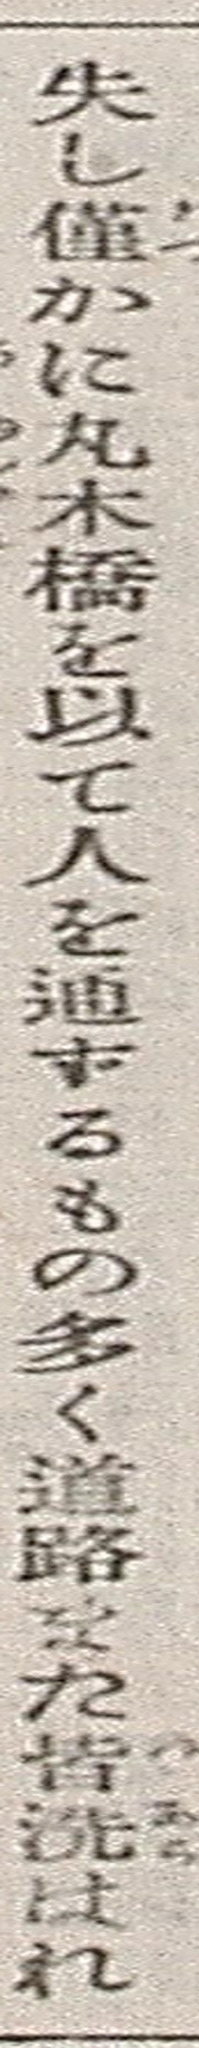失し僅かに丸木橋を以て人を通ずるもの多く道路また皆洗はれ
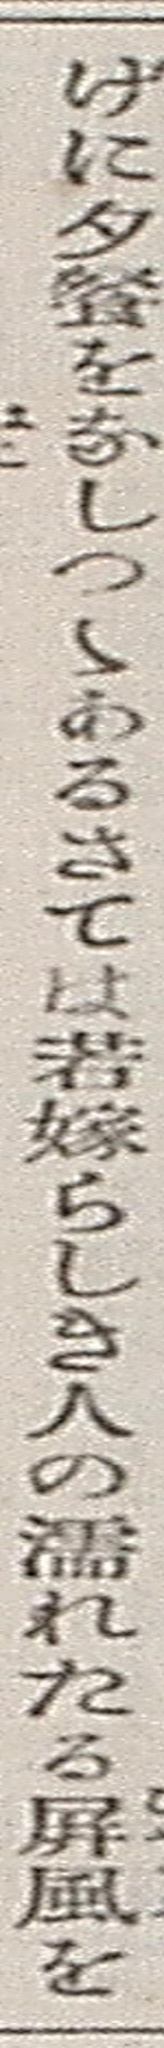げに夕餐をなしつゝあるさては若嫁らしき人の濡れたる屏風を
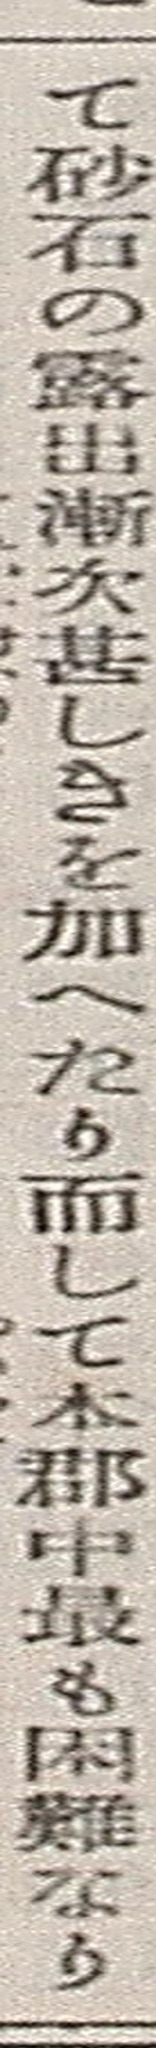て砂石の露出暫次甚しきを加へたり而して本郡中最も困難なり
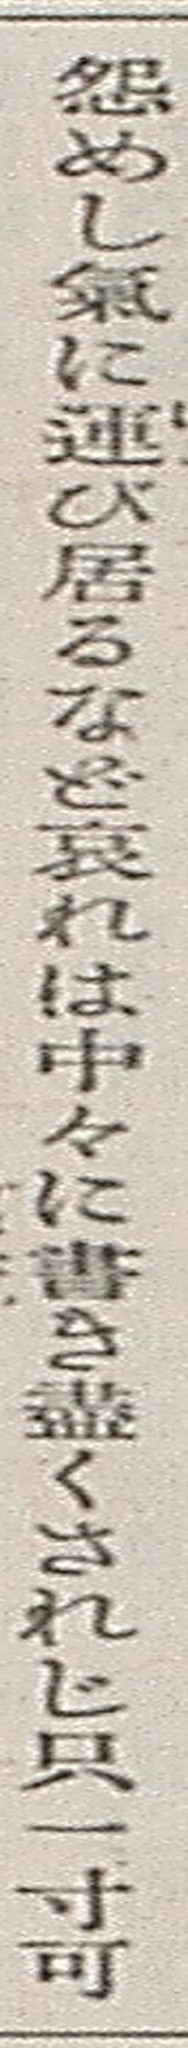恨めし気に運び居るなど哀れは中々に書き盡くされじ只一寸可
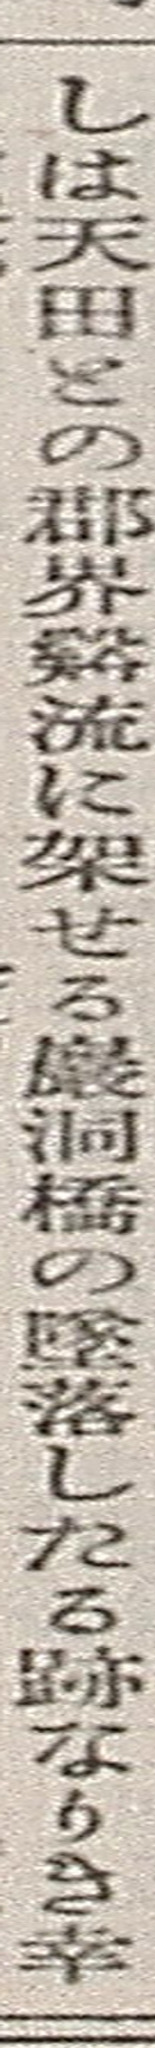しは天田との郡界谿流に架せる巌洞橋の墜落したる跡なりき幸
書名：風俗畫報臨時増刊第百二十六號　洪水被害録（中）
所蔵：東京大学地震研究所図書室 Earthquake Research Institute Library, The University of Tokyo, JAPAN
